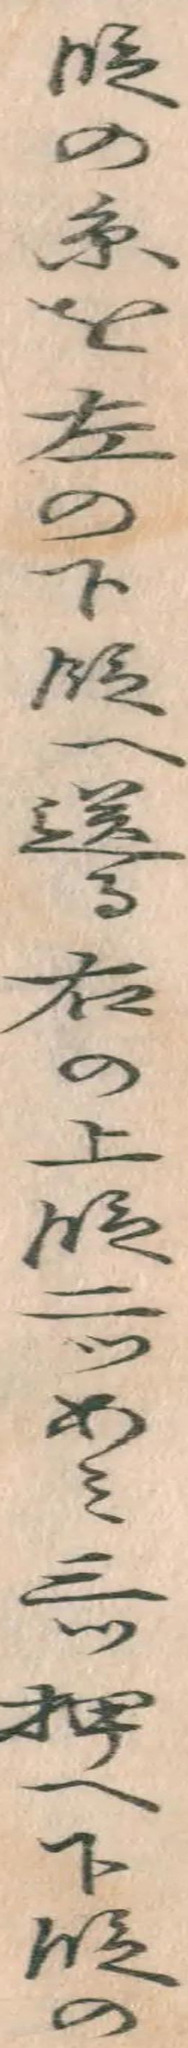段の糸を左の下段へ送る右の上段二ッあみ三ッ押へ下段の
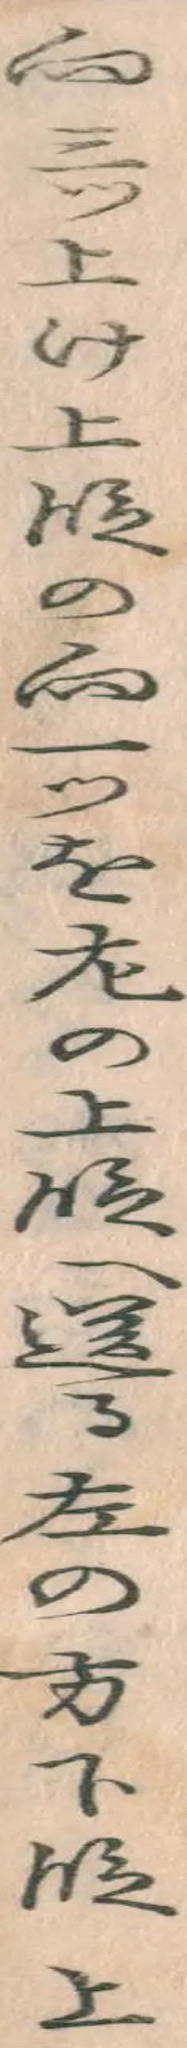向三ッ上け上段の向一ッを左の上段へ送る左の方下段上

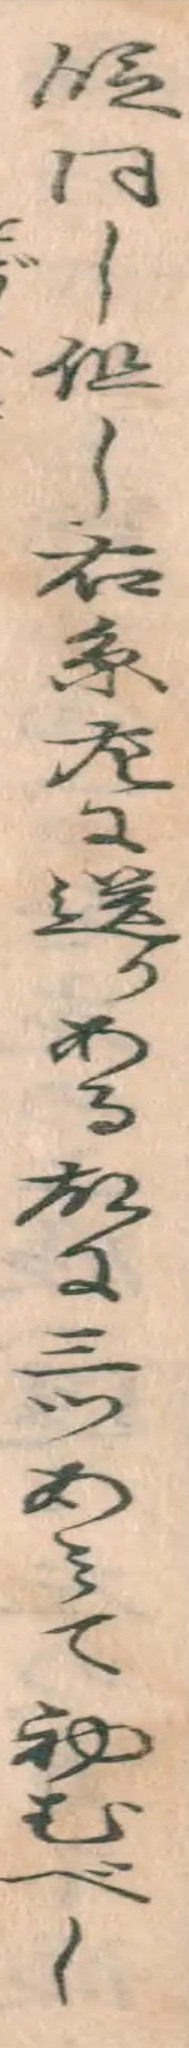段同し但し右糸左に送りある故に三ッあみて初むべし
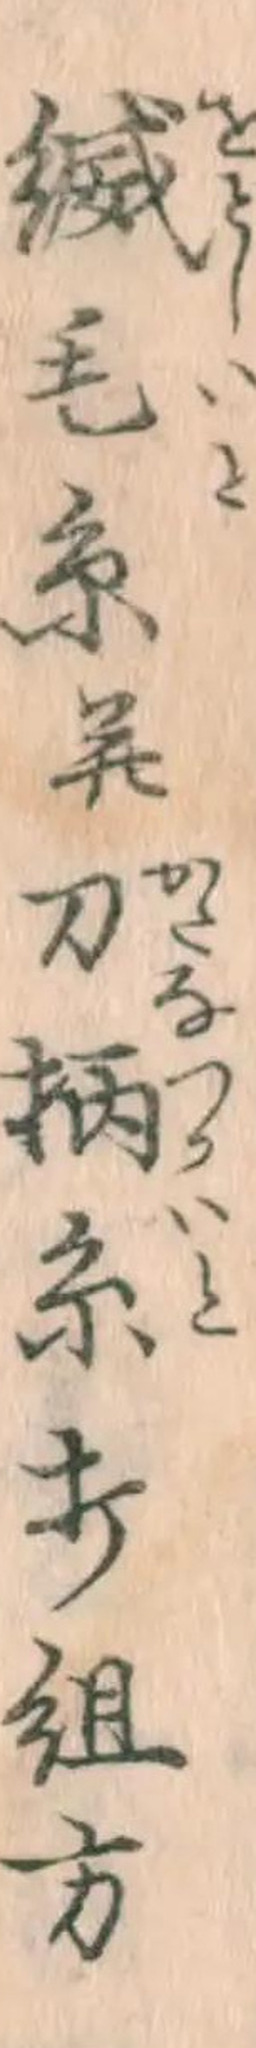縅毛糸幷刀柄糸打組方
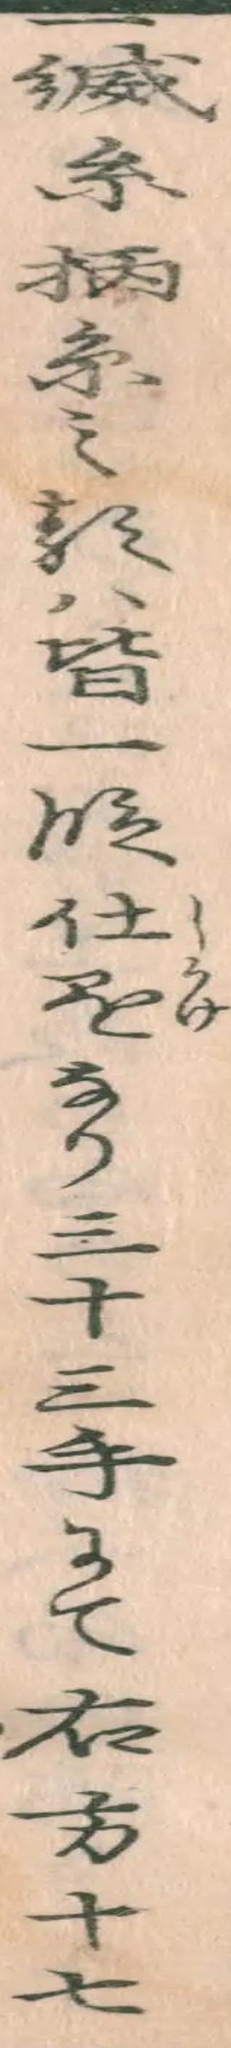一縅糸柄糸之類は皆一段仕懸なり三十三手にて右方十七
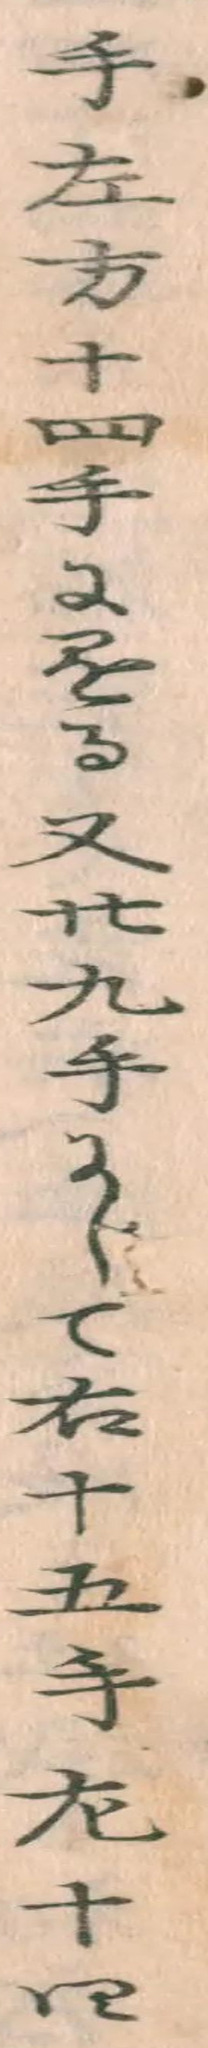手左方十四手に懸る又廿九手にして右十五手左十四
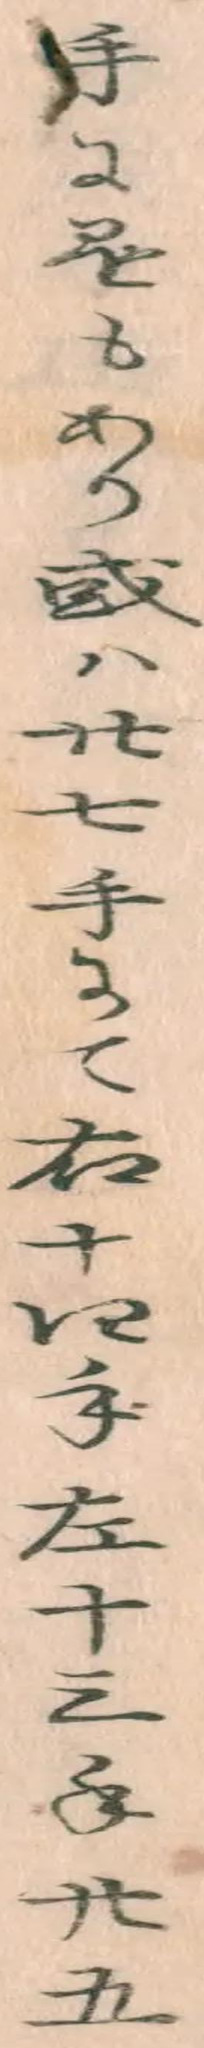手に懸もあり或は廿七手にて右十四手左十三手廿五
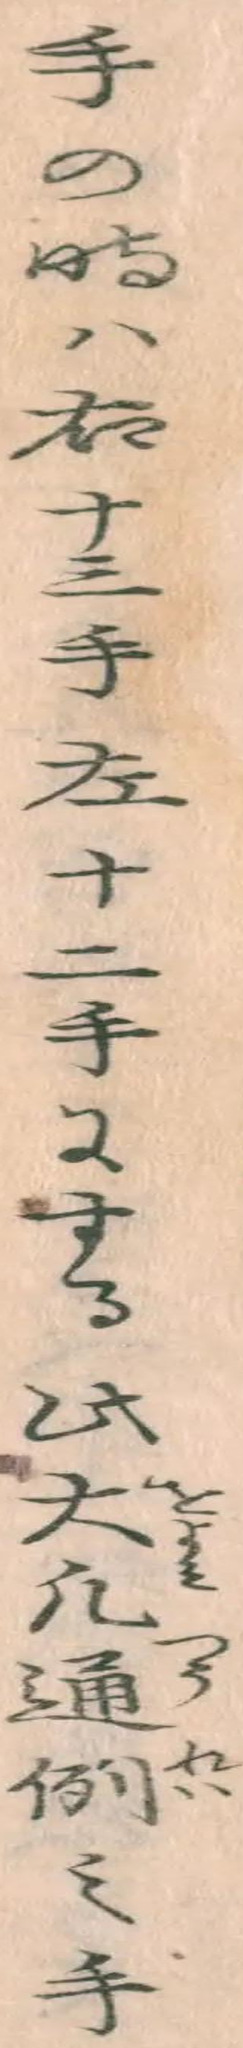手の時は右十三手左十二手にする此大凡通例之手
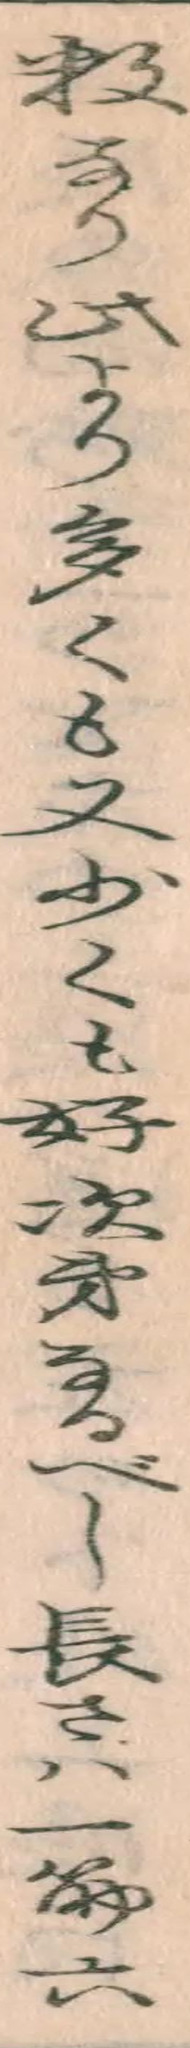数なり此より多くも又少くも好次第なるべし長さは一筋六
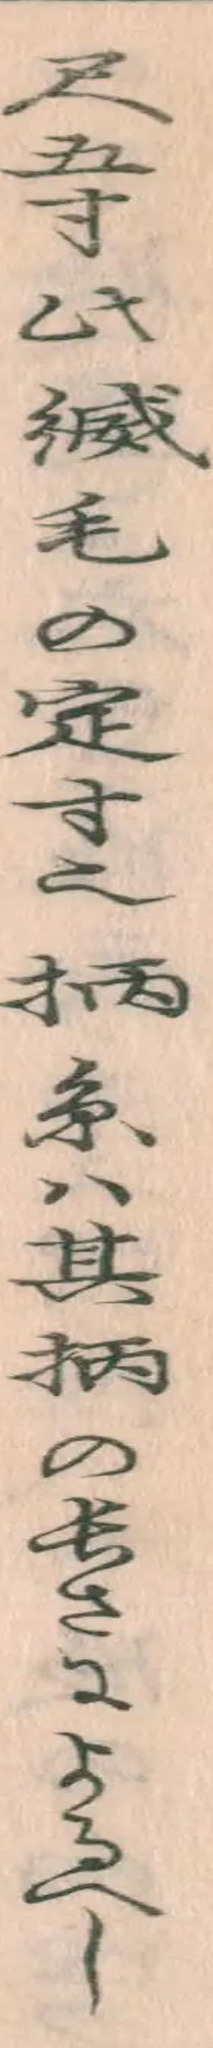尺五寸此縅毛の定寸也柄糸は其柄の長さによるへし
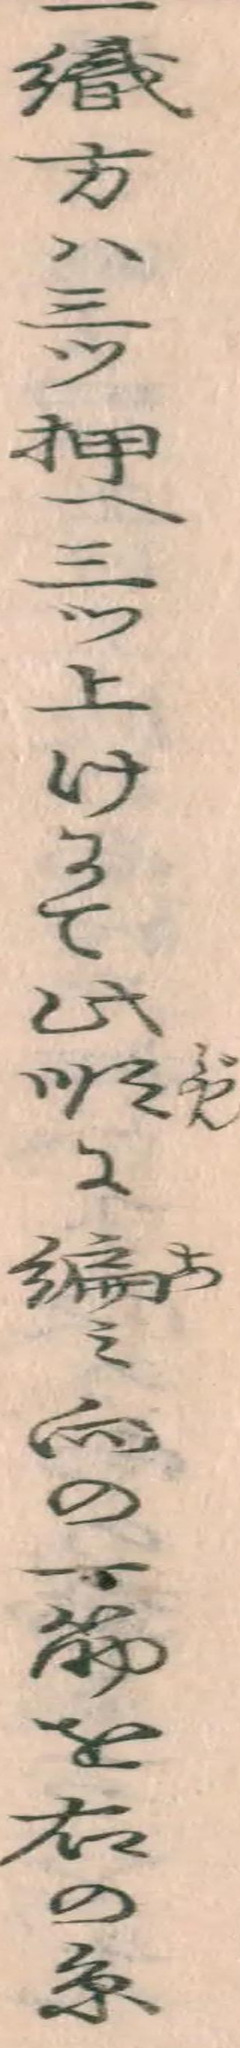一織方は三ッ押へ三ッ上けにて此順に編み向の一筋を右の糸
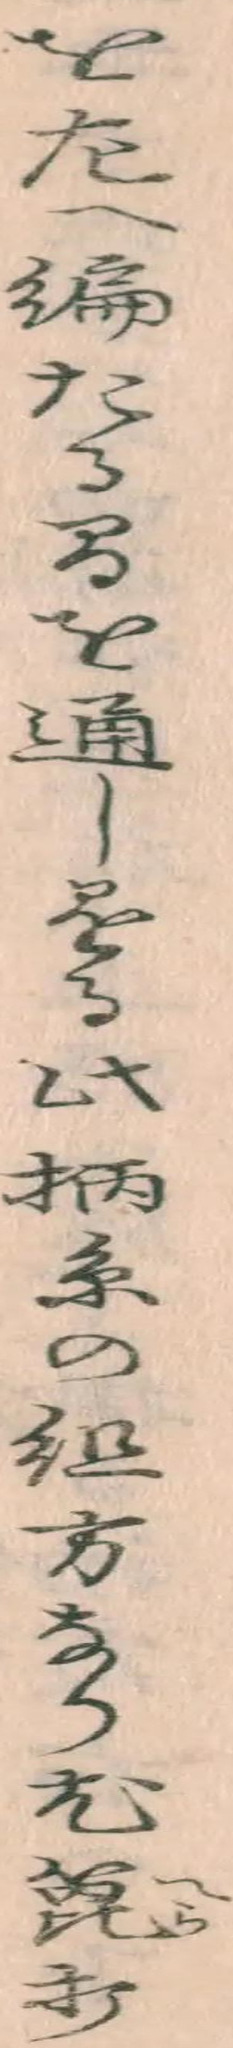を左へ編たる間を通し懸る此柄糸の組方なり尤箆打
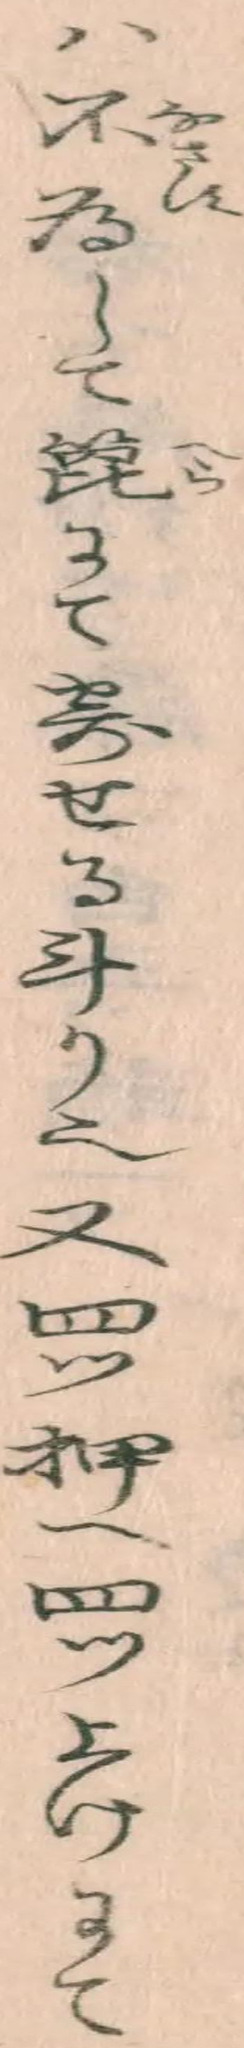は不為して箆にて寄せる斗り也又四ッ押へ四ッ上けにて
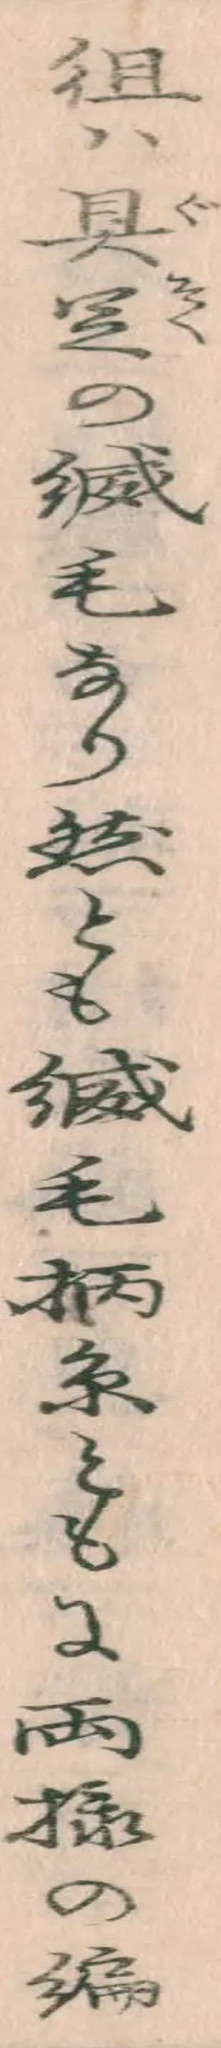徂は具足の縅毛なり然とも縅毛柄糸ともに両様の編
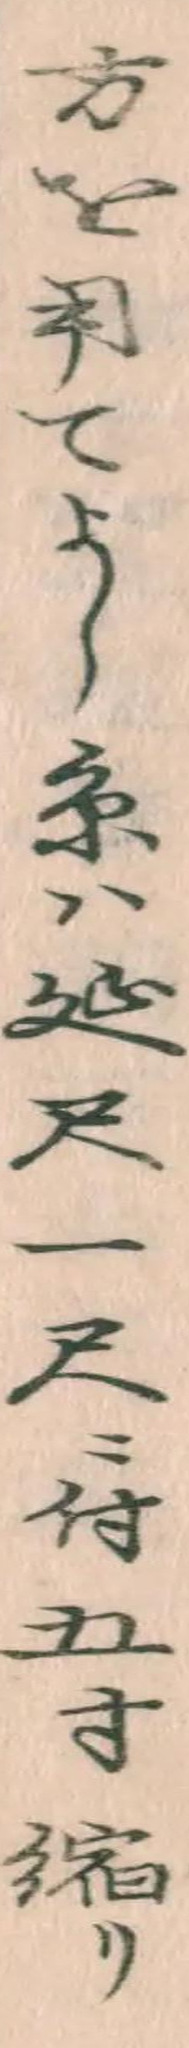方を用てよし糸は延尺一尺に付五寸縮り
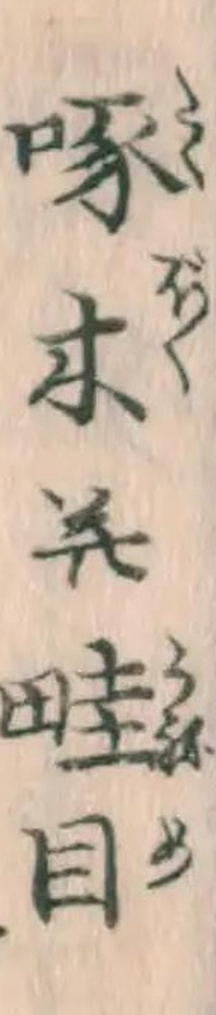啄木幷畦目
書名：機織彙編 5巻. [2]
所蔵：国立国会図書館 National Diet Library, JAPAN
